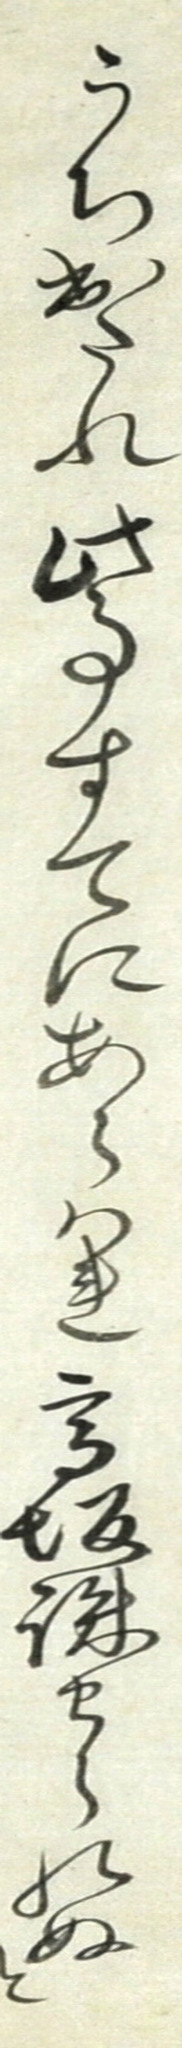うち出たれ此事すてにあらはれ高坂誅せられぬと
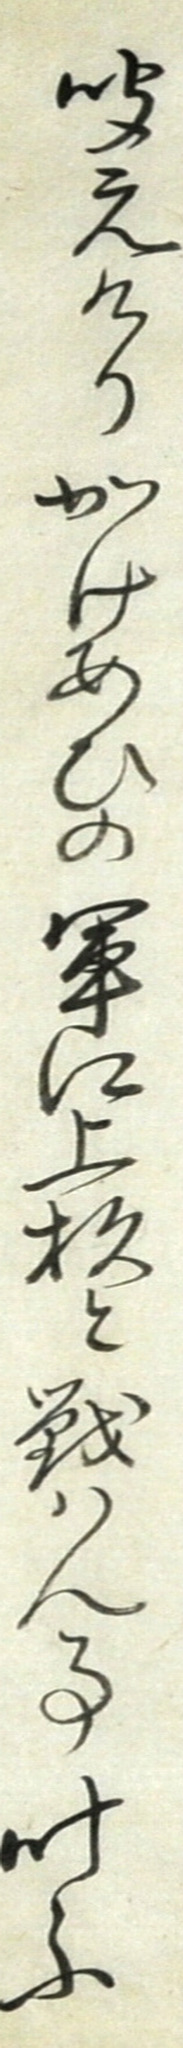聞えけりかけあひの軍に上杉と戦はん事叶ふ
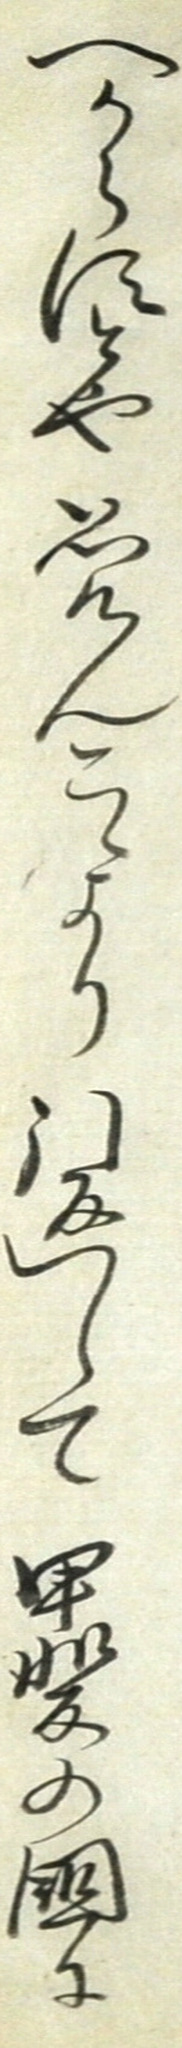へからすとや思けんこゝより引返して甲斐の国に
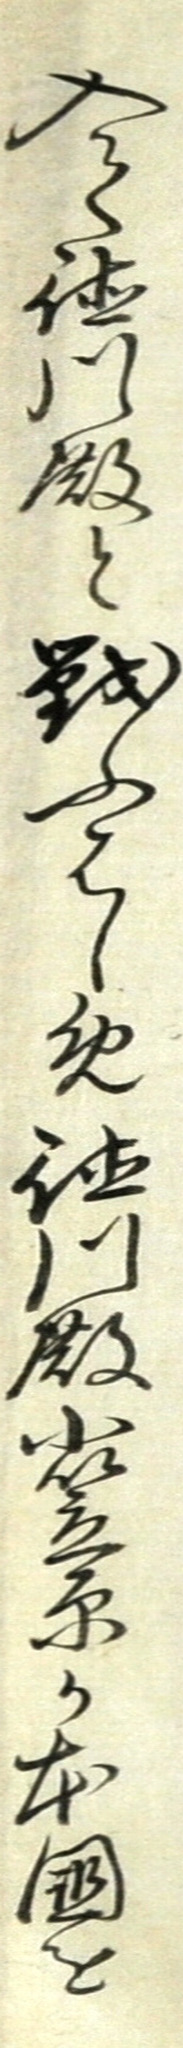入て徳川殿と戦ふはしめ徳川殿小笠原か本国を

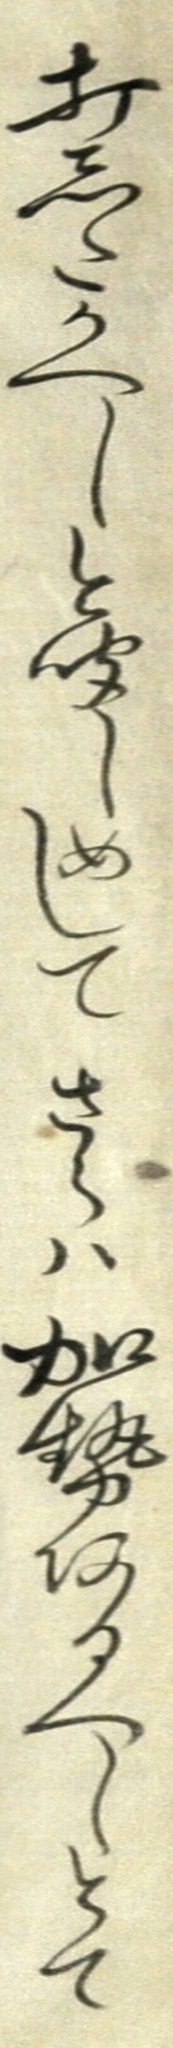打したかへしと聞しめしてさらは加勢あるへしとて
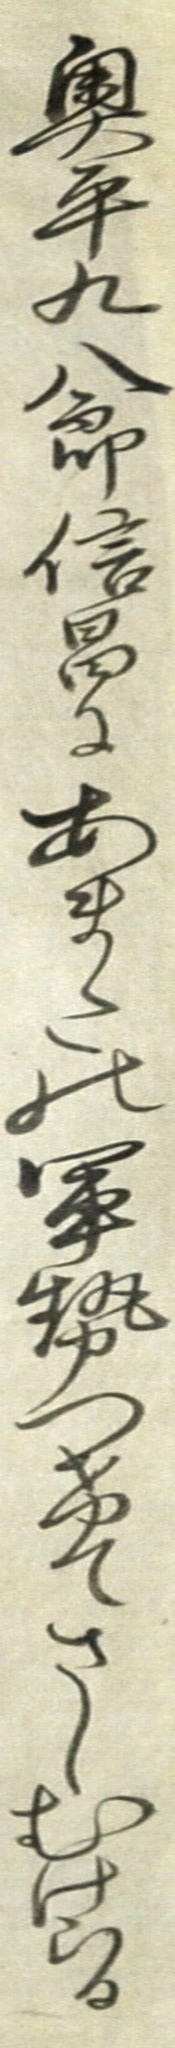奥平九八郎信昌にあまたの軍勢つけてさしむけらる
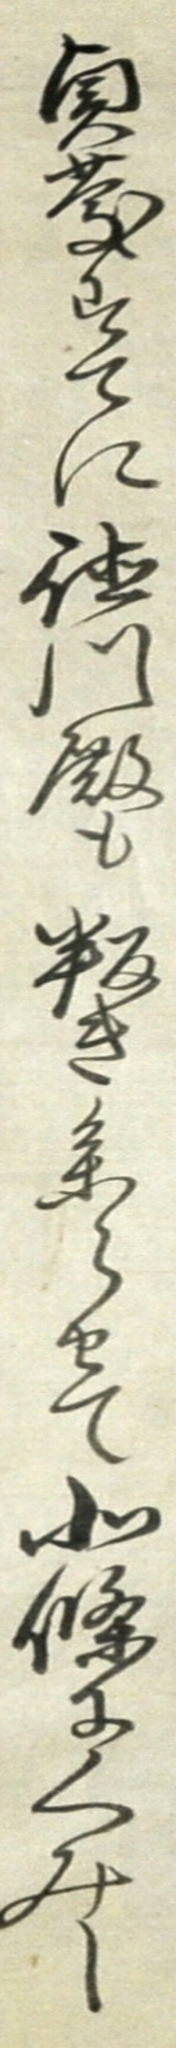貞慶すてに徳川殿も叛き参らせて北条にくみし
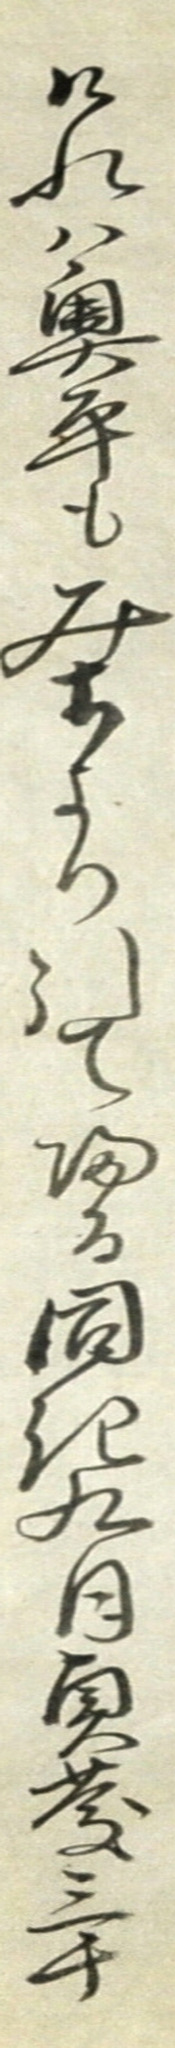けれは奥平もみちより引て帰る同き九月貞慶三千
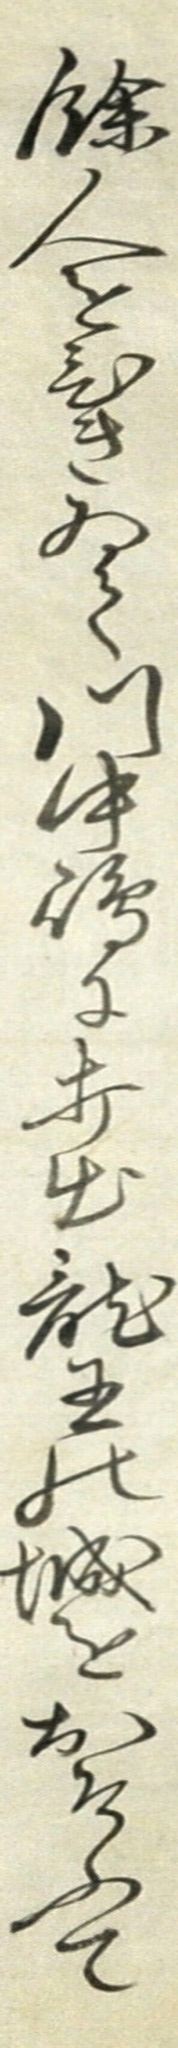余人をひきゐて川中島に打出竜王の城をおそふて
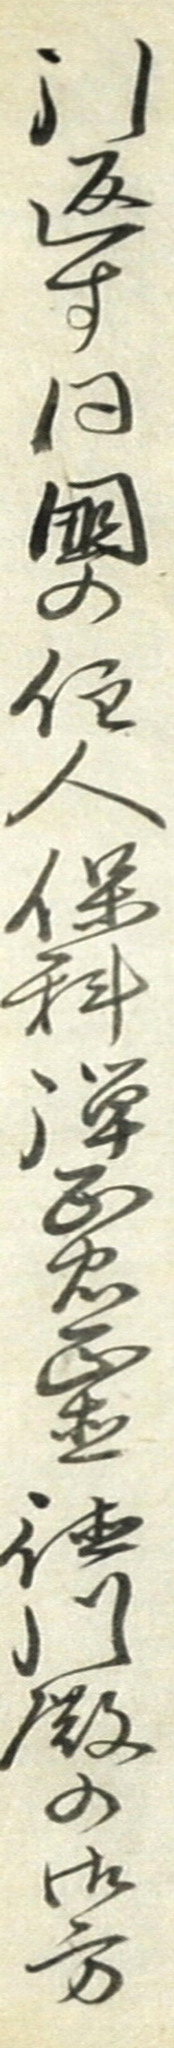引返す同国の住人保科弾正忠正直徳川殿の御方
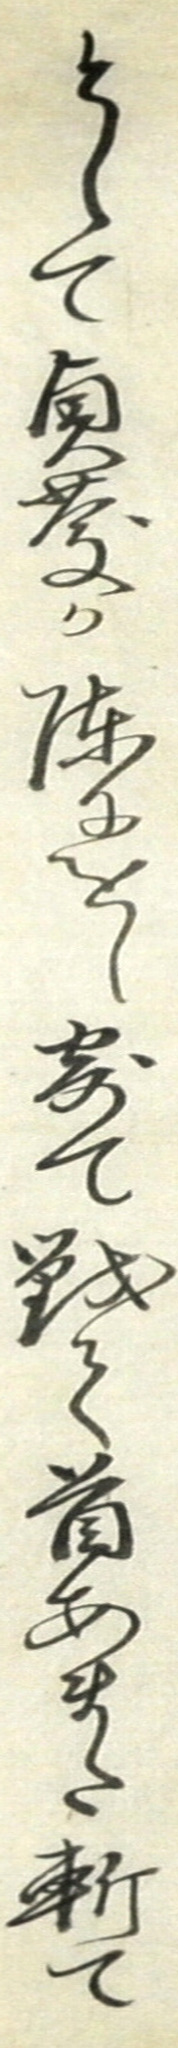として貞慶か陣にをし寄て戦て首あまた斬て
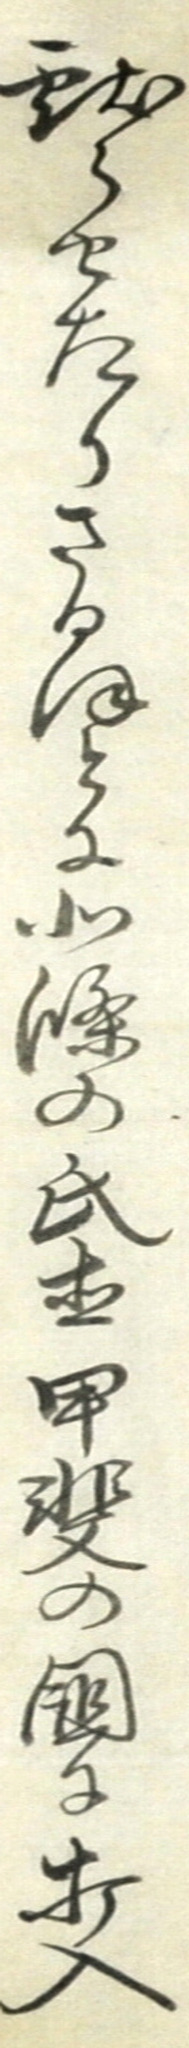献らせたりさるほとに北条の氏直甲斐の国に打入
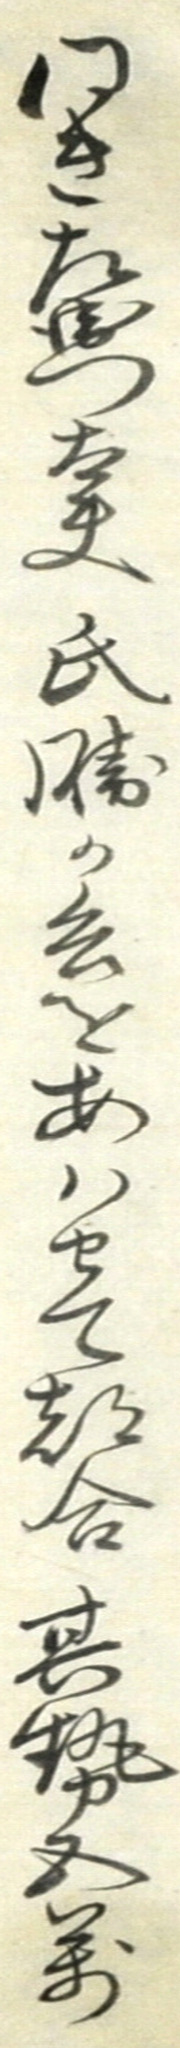同き左衛門太夫氏勝か兵をあはせて都合其勢五万
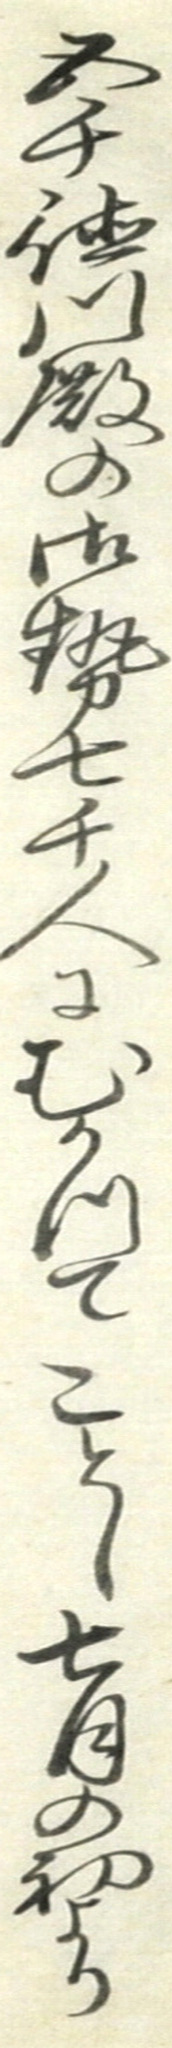五千徳川殿の御勢七千人にむかつてことし七月の初より
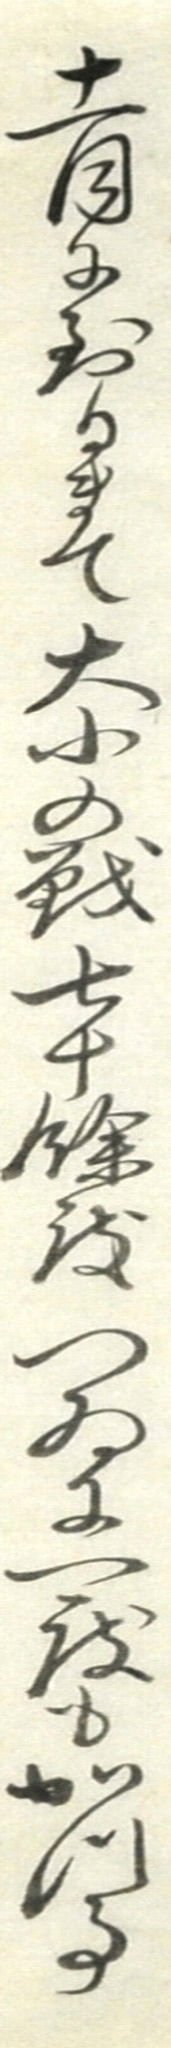十一月に到るまて大小の戦七十余度つゐに一度もかつ事
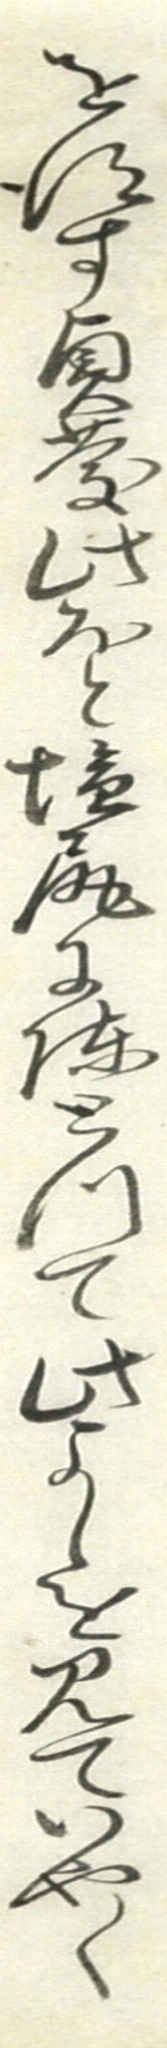を得す貞慶此ほと塩尻に陣とつて此よしを見ていや〳〵
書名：藩翰譜（六）
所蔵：伊那市立高遠町図書館・合同会社AMANE
